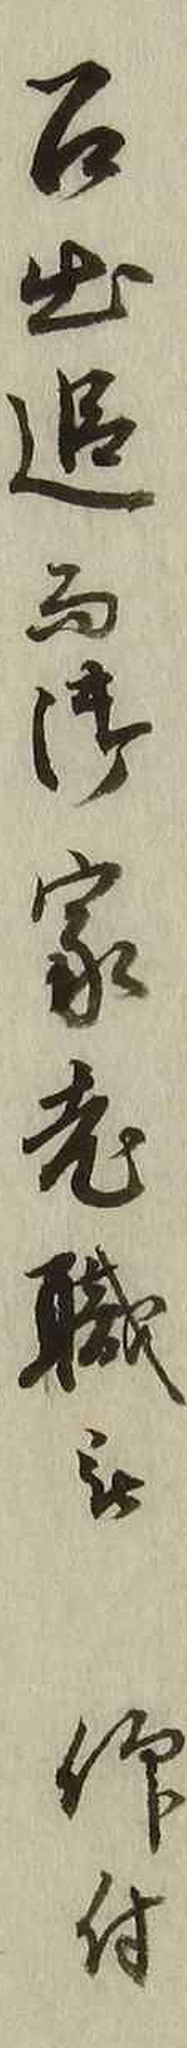召出追而御家老職被仰付
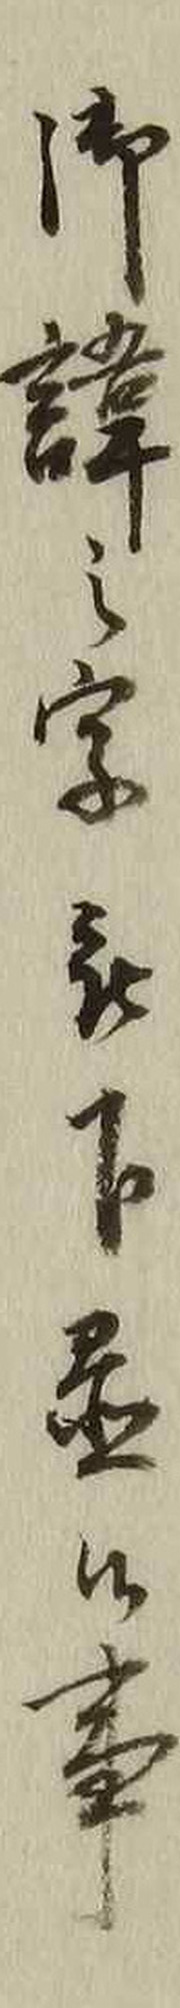御諱之字被下置候事
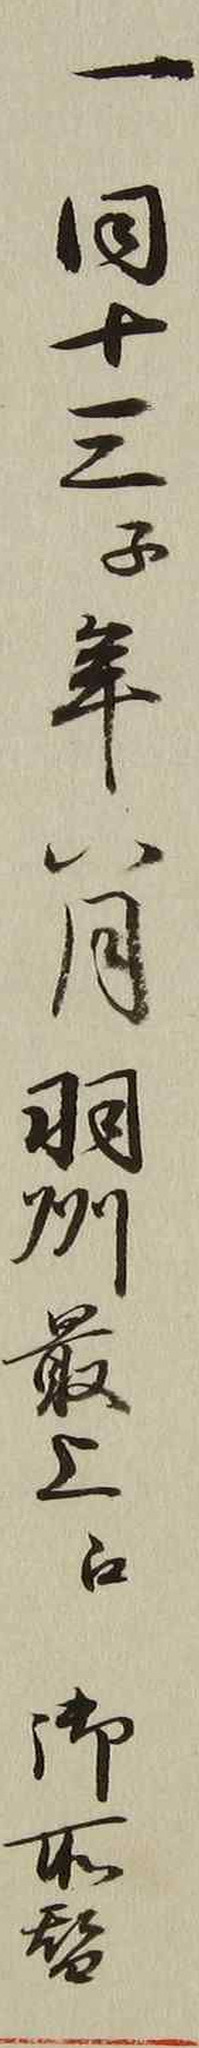一同十三子年八月羽州最上江御所替
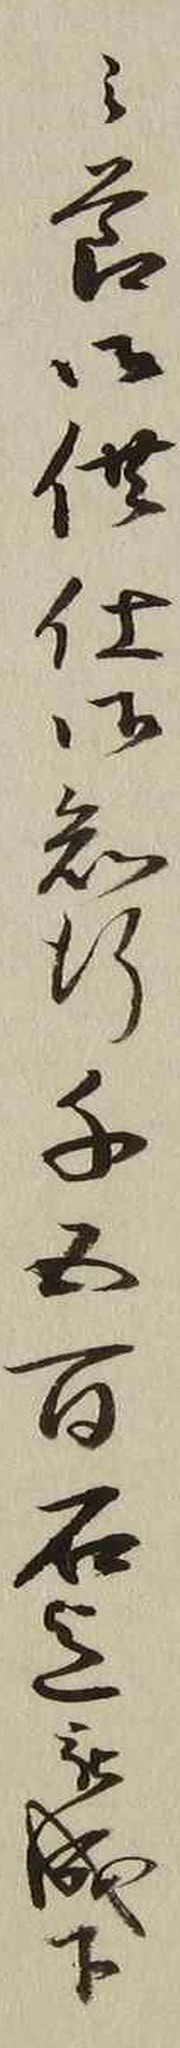之節御供仕御知行千五百石迄被成下
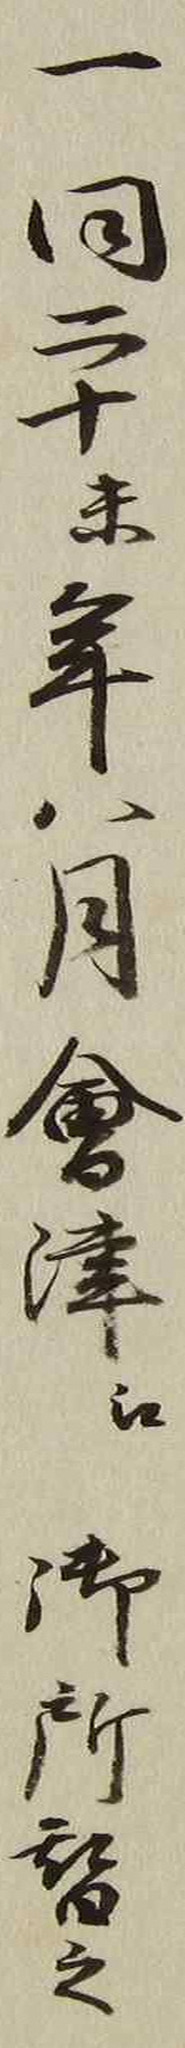一同二十未年八月会津江御所替之
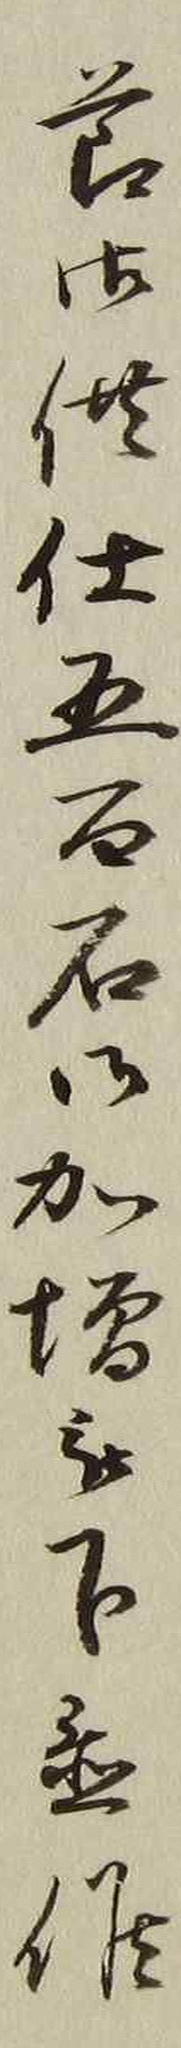節御供仕五百石御加増被下置候
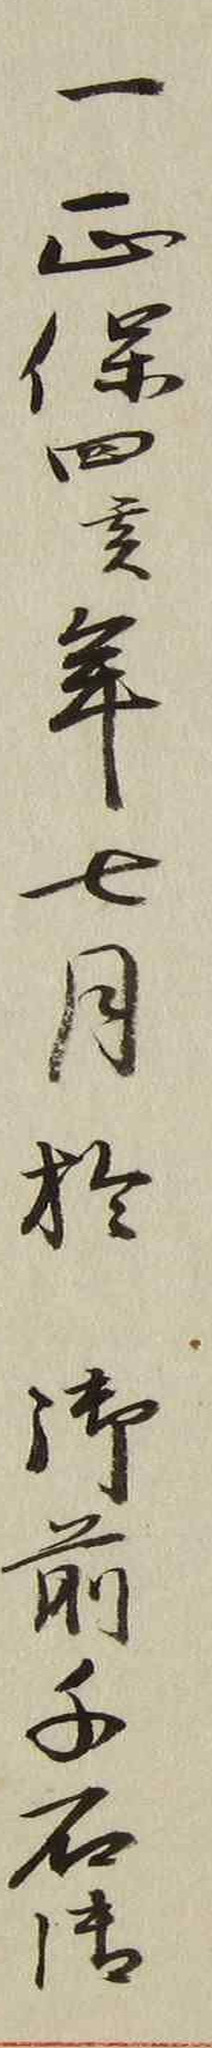一正保四亥年七月於御前千石御
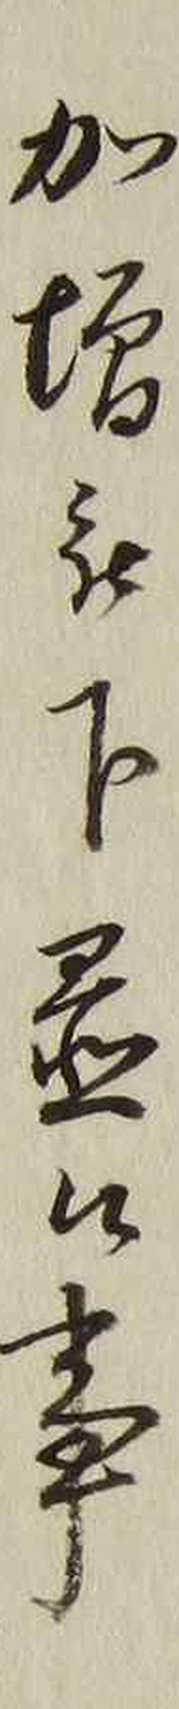加増被下置候事
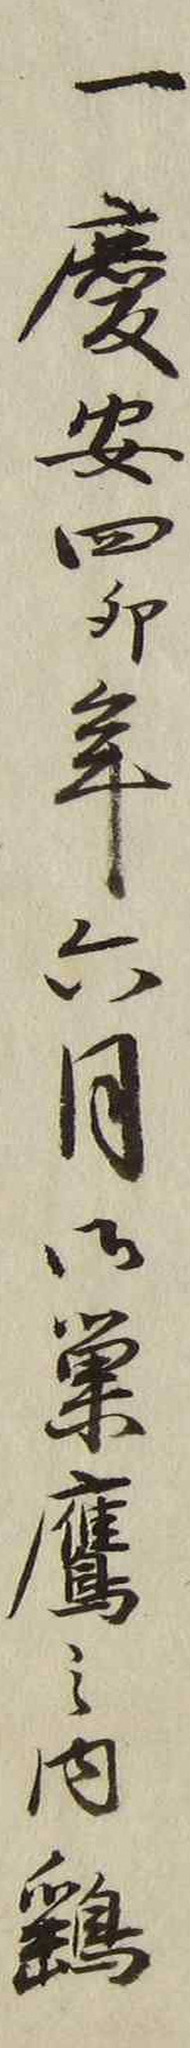一慶安四卯年六月御巣鷹之内鷂
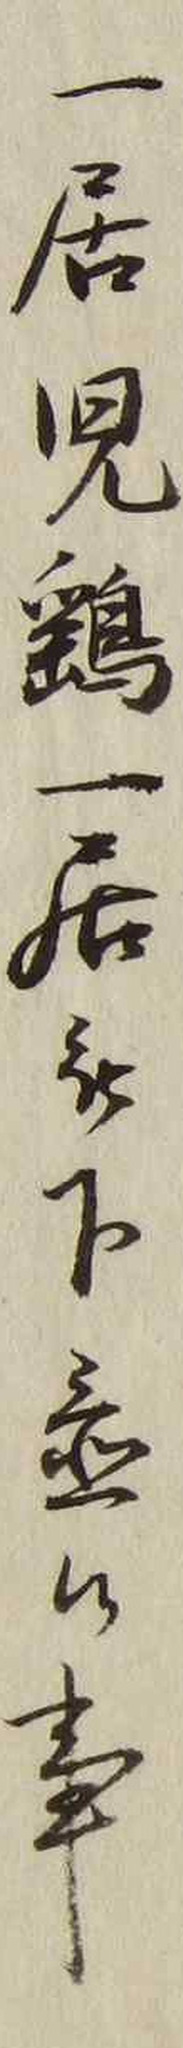一居児鷂一居被下置候事

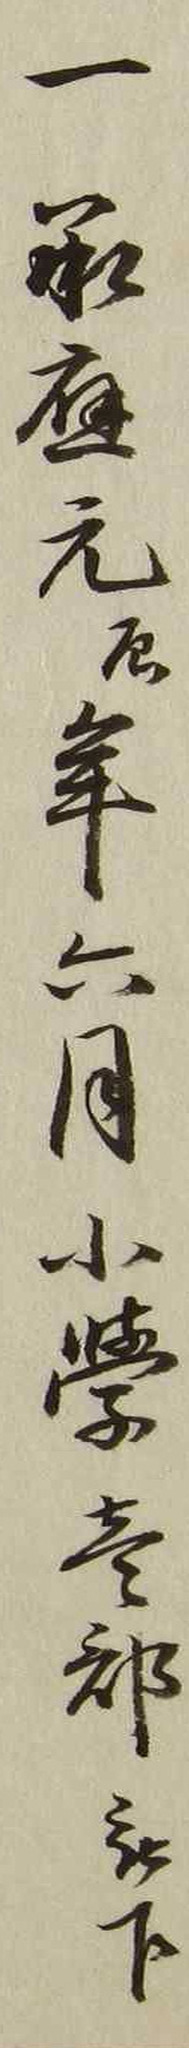一承応元辰年六月小学壱部被下
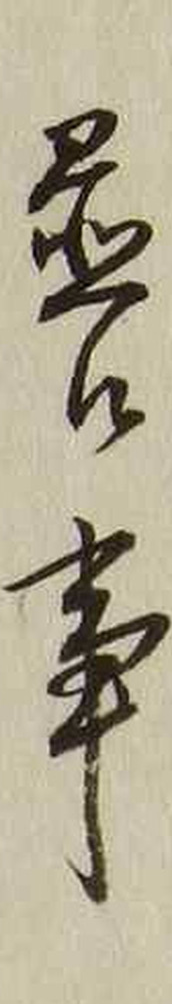置候事
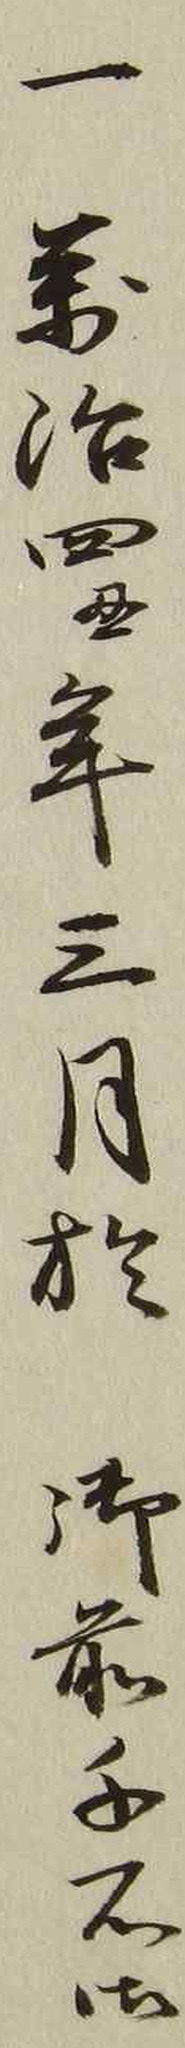一万治四丑年三月於御前千石御
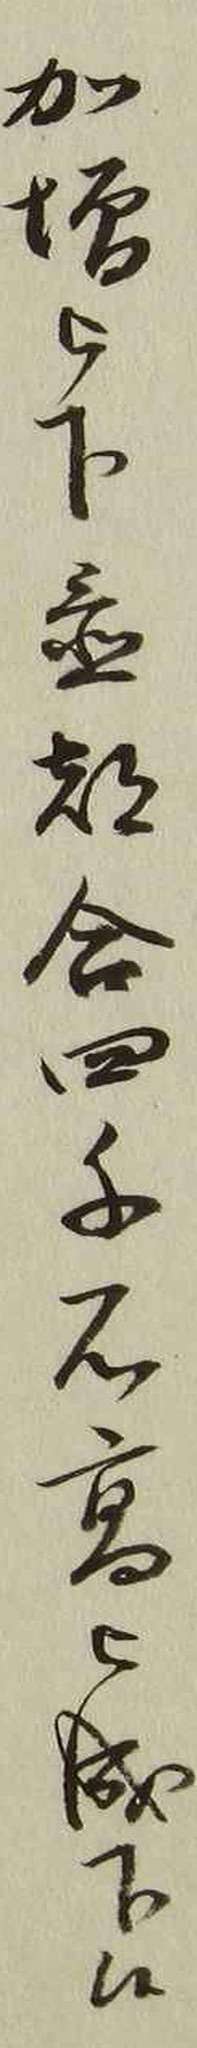加増被下置都合四千石高被成下候
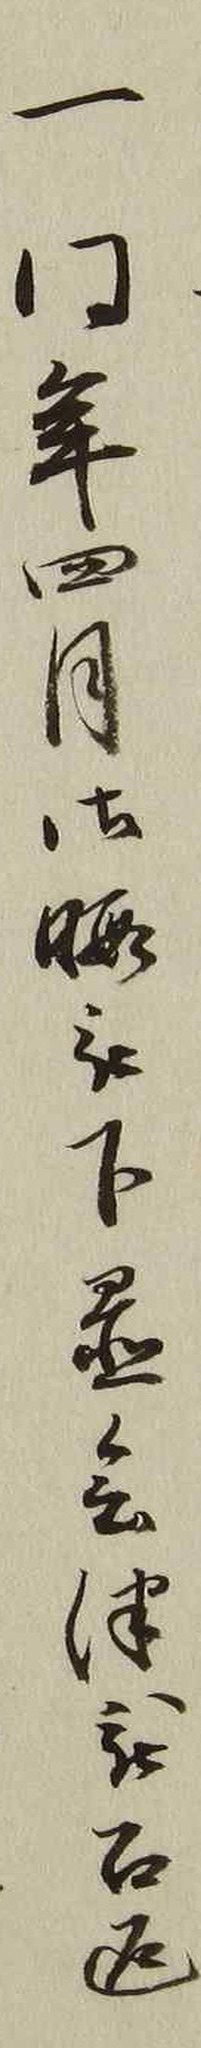一同年四月御暇被下置会津へ被召返
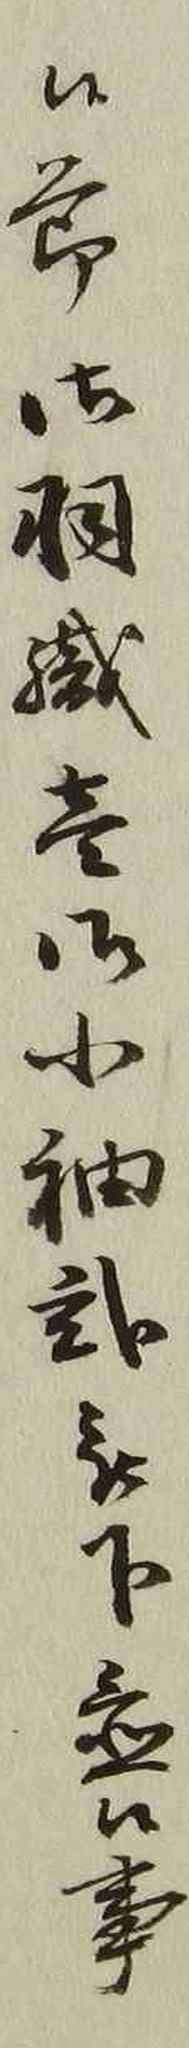候節御羽織壱御小袖弐被下置候事
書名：諸士系譜　巻之125　た之部1
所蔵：会津若松市立会津図書館
